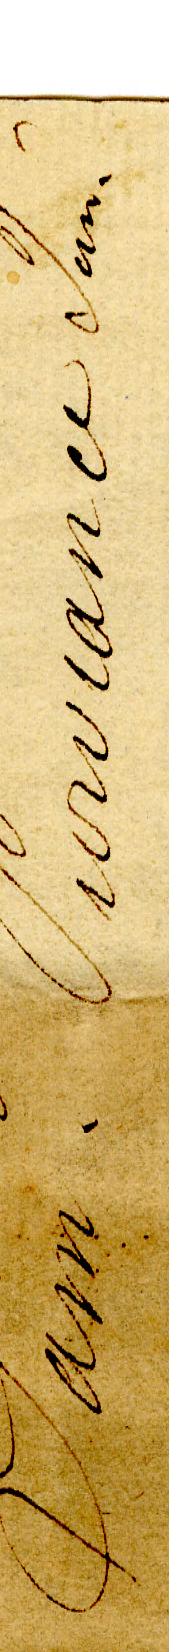Sam.^l Purviance Jun^r.
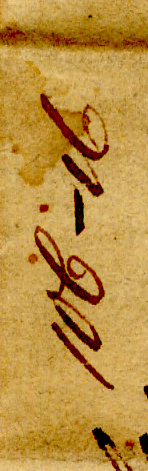106-16
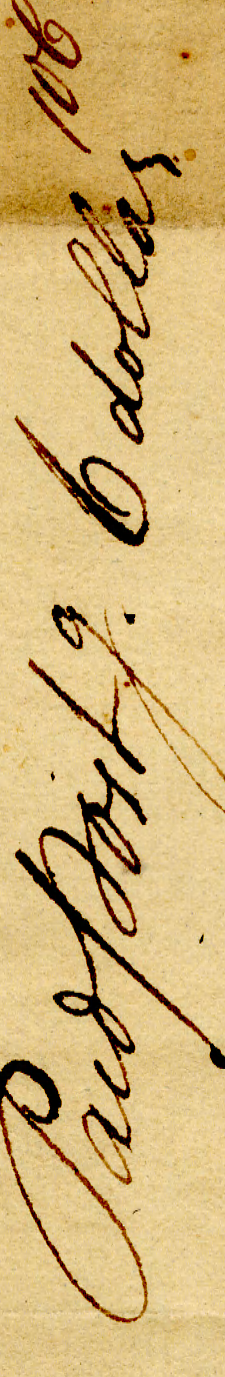Paid Post^g. 6 dollar
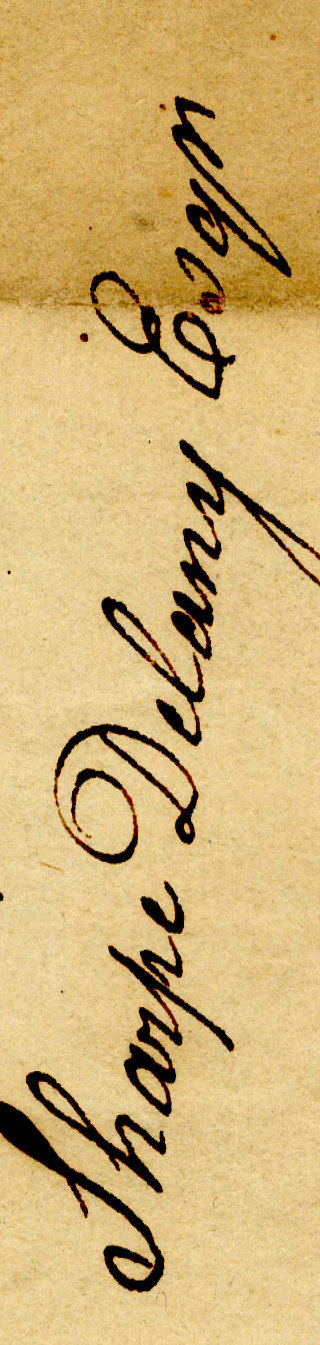Sharpe Delany Esqr
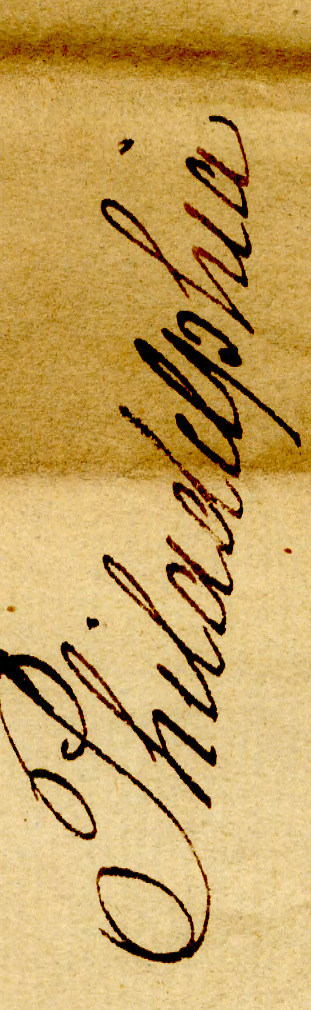Philadelphia
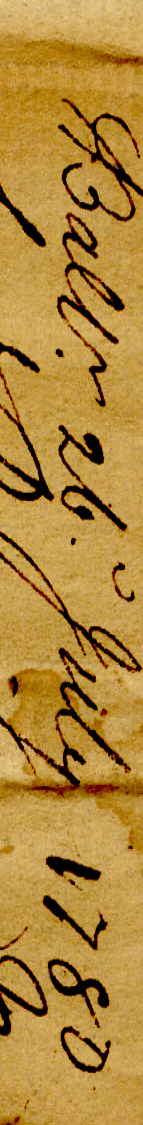Balt.^r 26. July 1780
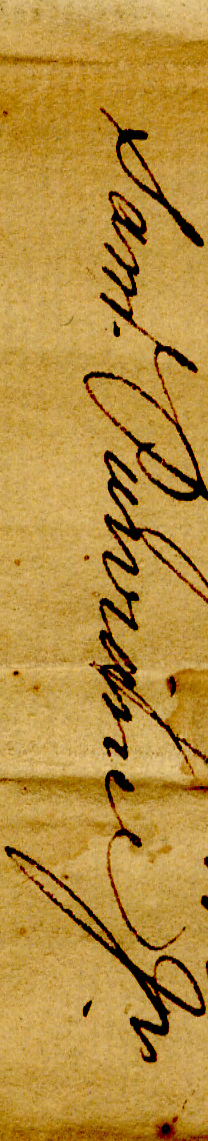Sam.^l Purviance J.^r
